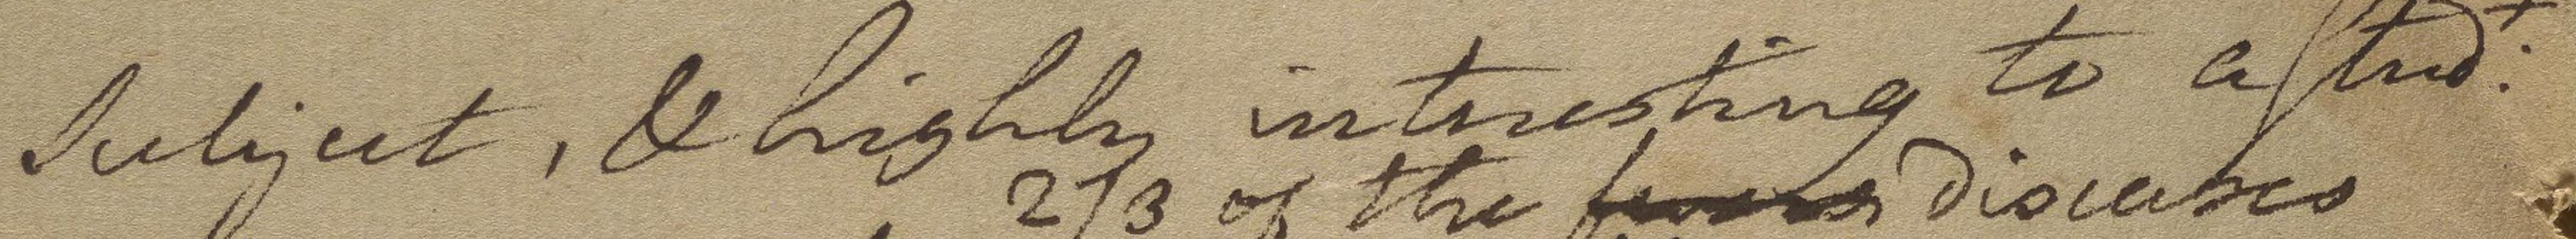subject, & highly interesting to a stud^t:
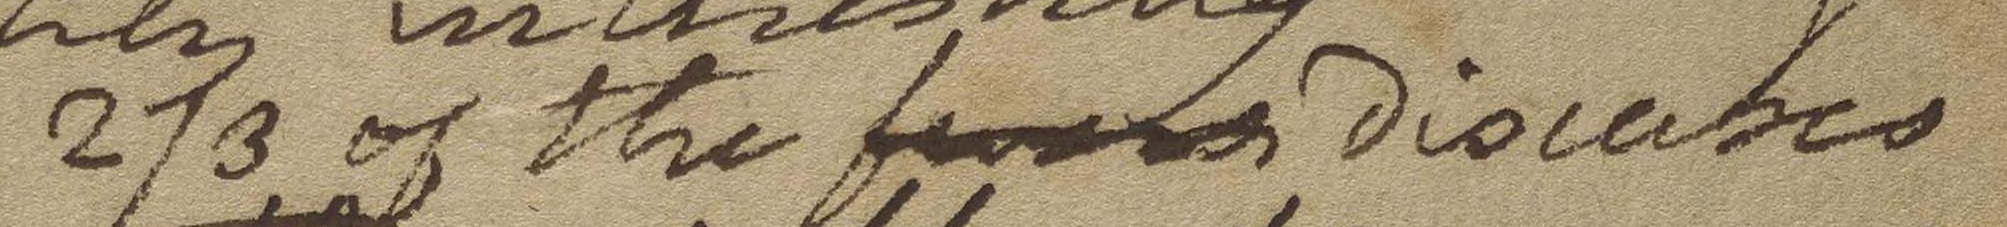2/3 of the [fevers] diseases
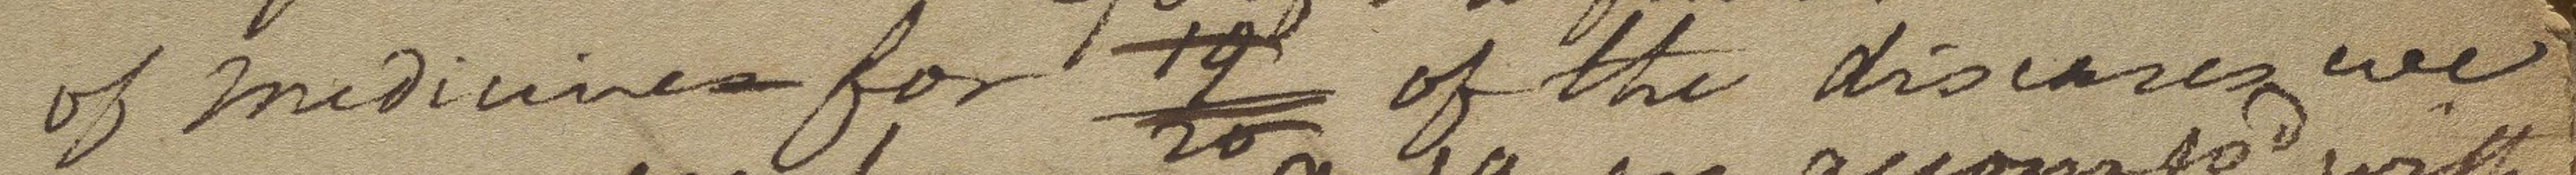of medicines for [19/20] of the diseases we
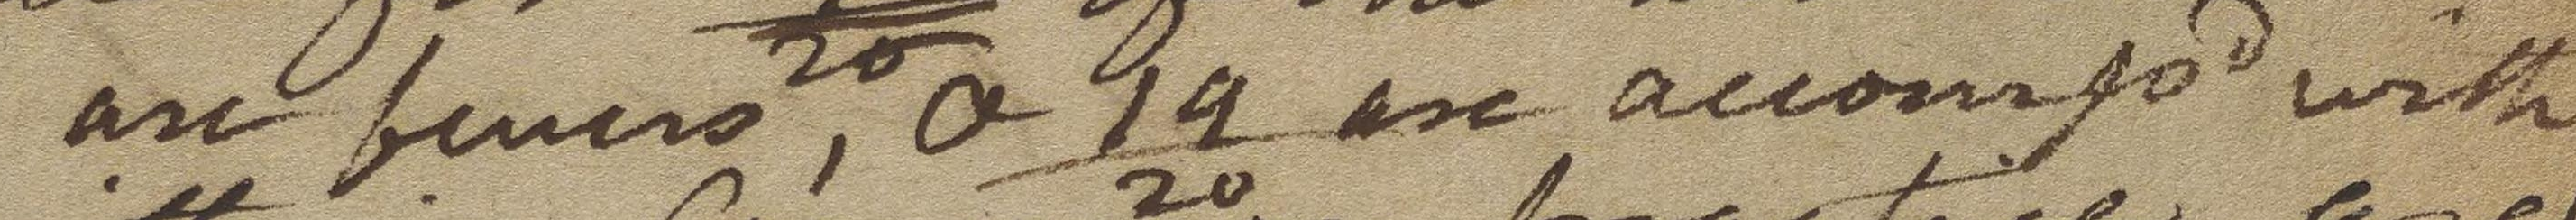are fevers, & 19/20 are accomp^d with
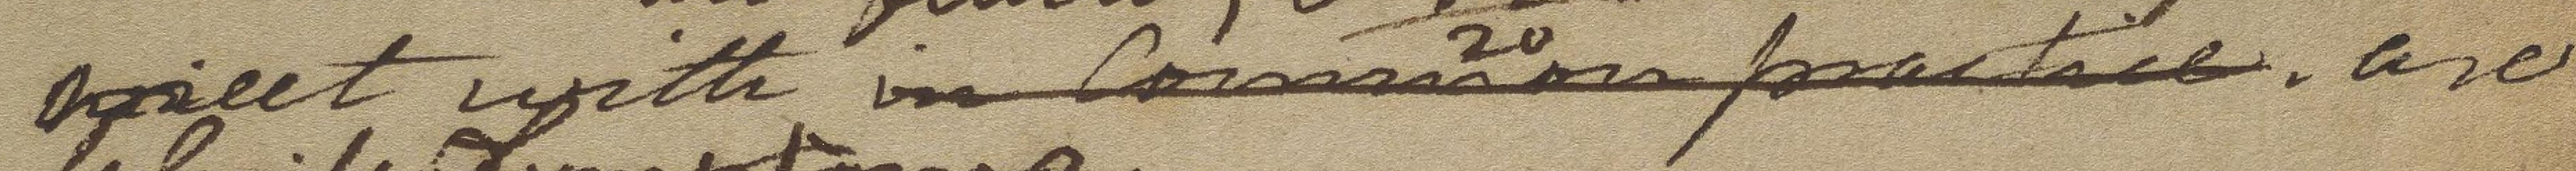expect with [in Common practice]. are
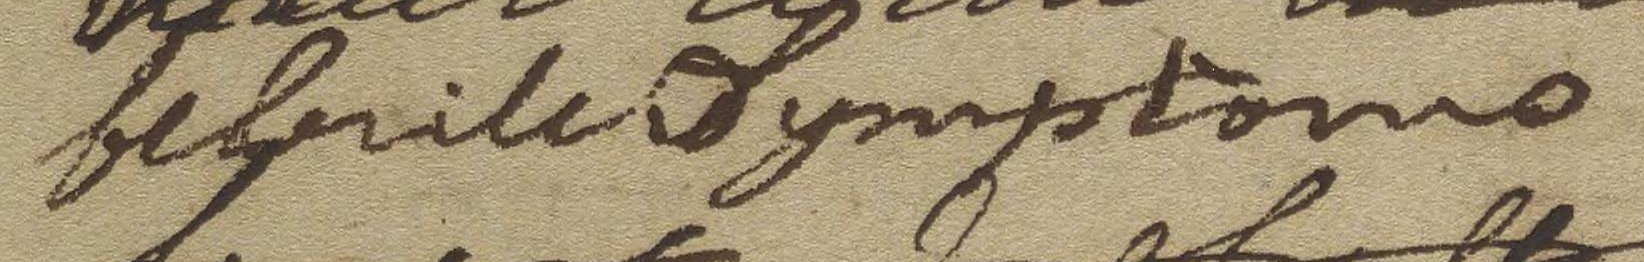febrile symptoms
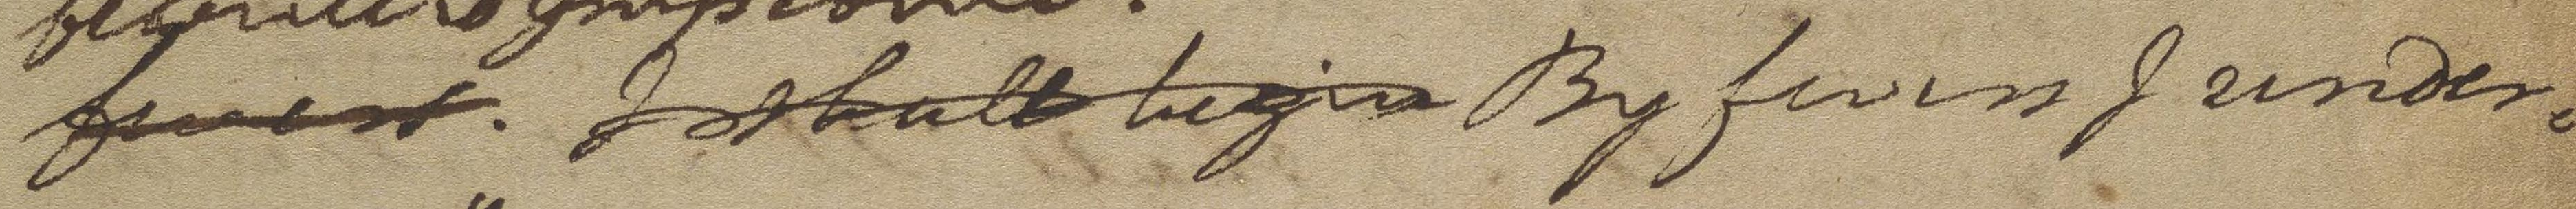[fevers]. [I shall begin] By fevers I under-
